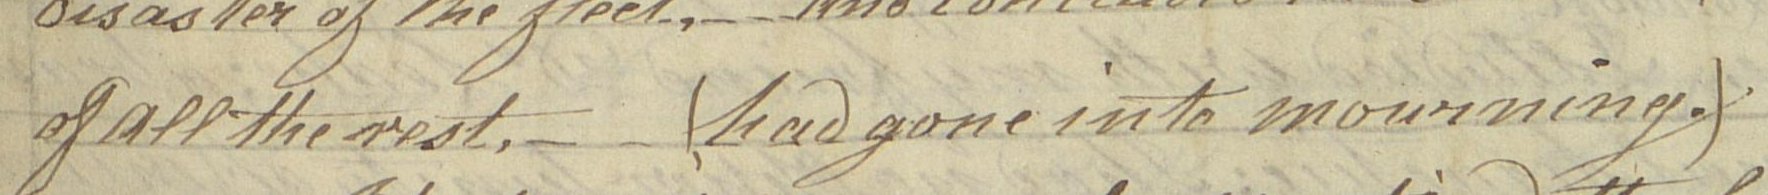of all the rest. (had gone into mourning.)
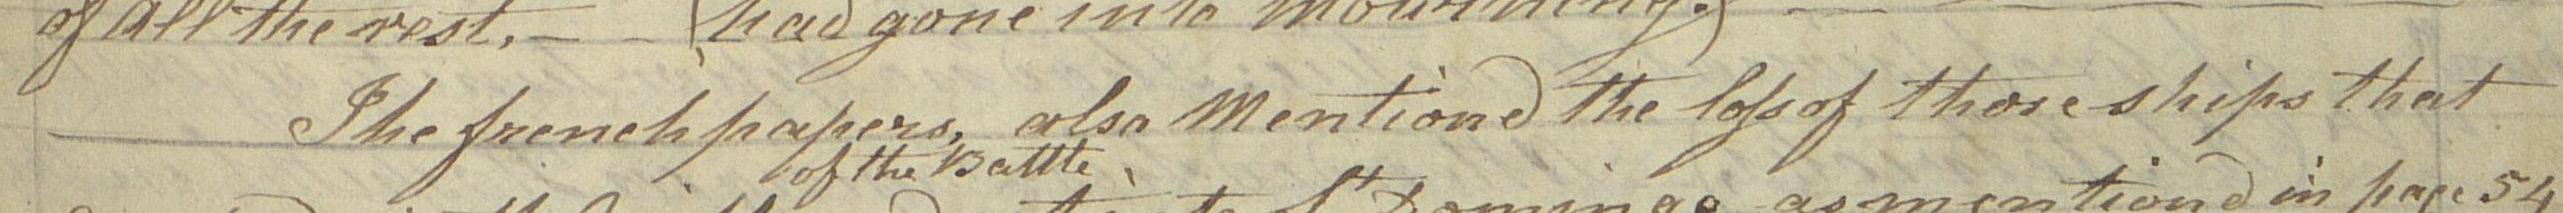The french papers, also Mentiond the loss of those ships that
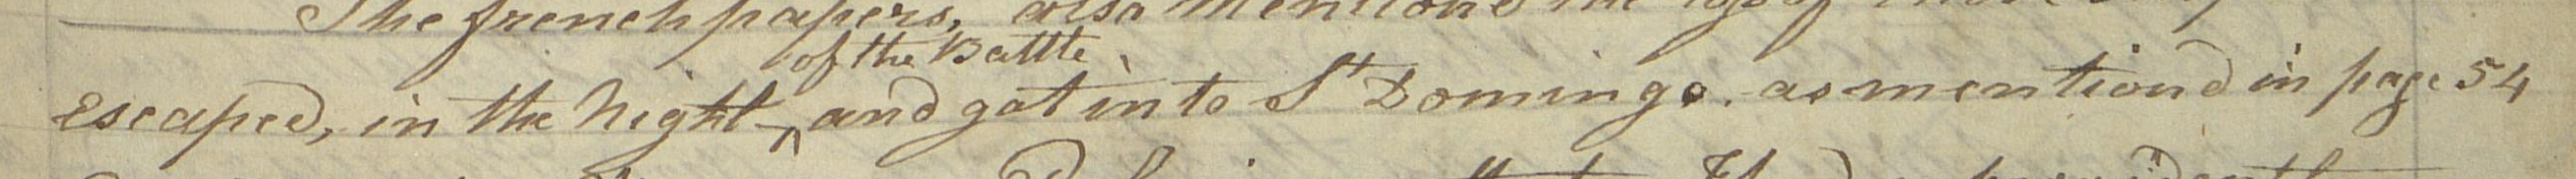escaped, in the Night, ^ and got in to S^t Domingo as mentiond in page 54
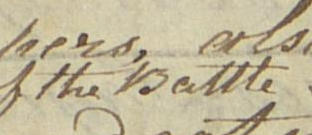the Battle
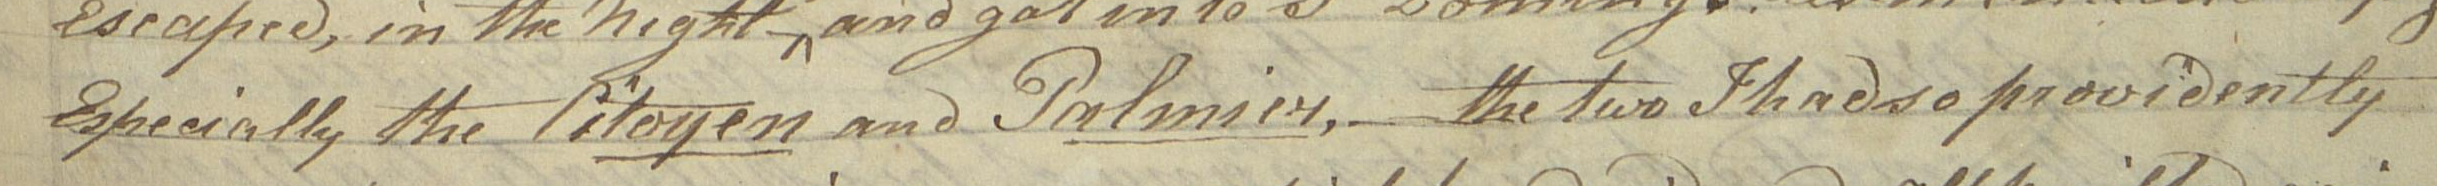Especially the Citoyen and Palmier, the two I had so providently
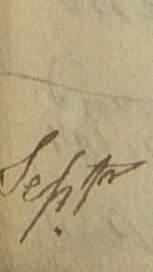Sept^r
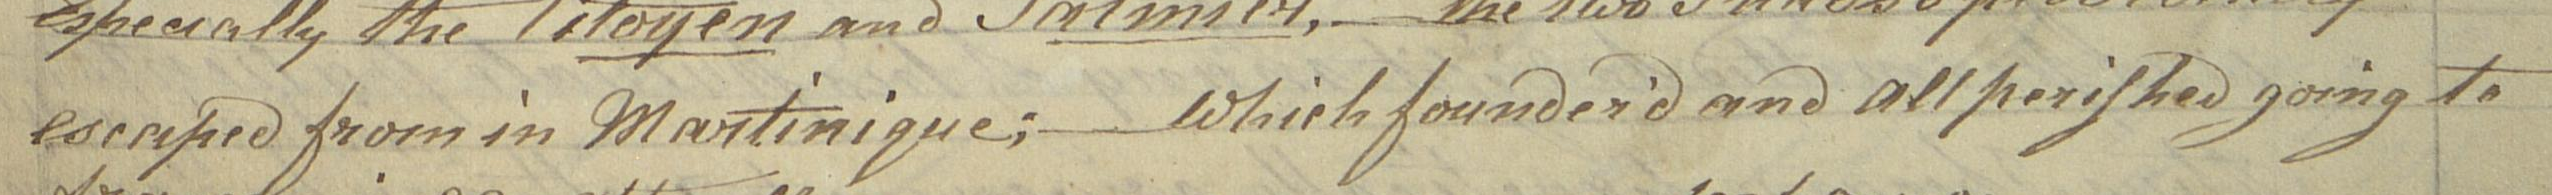escaped from in Martinique; which founder'd and all perished going to
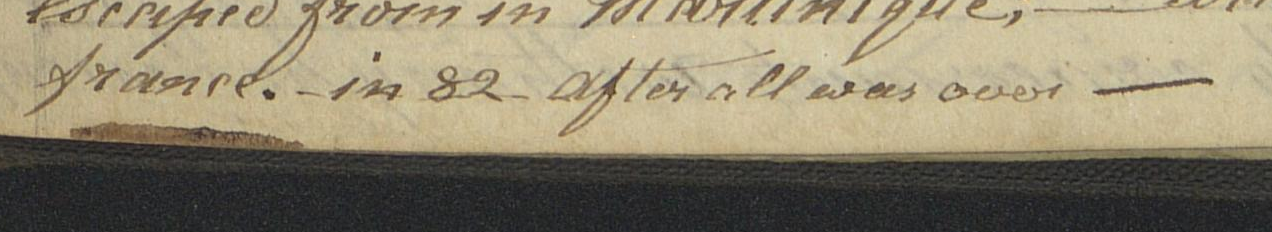france. in 82 after all was over
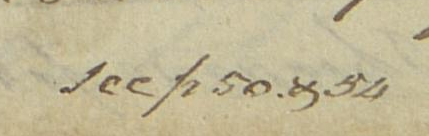see p50 & 54
